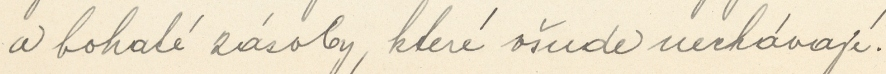a bohaté zásoby, které všude nechávají.
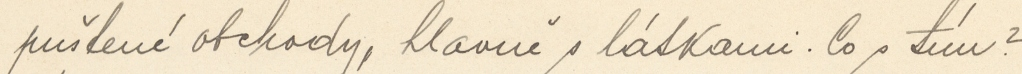puštěné obchody, hlavně s látkami. Co s tím?
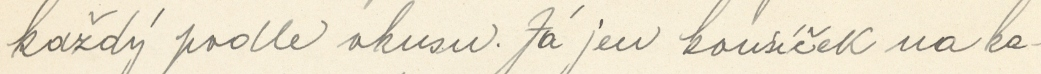každý podle vkusu. Já jen kousíček na ka-
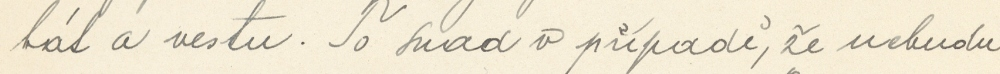bát a vestu. To snad v případě, že nebudu
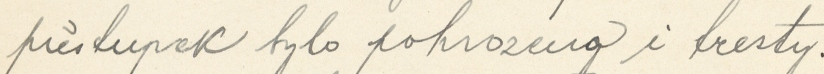přestupek bylo pohrozeno i tresty.
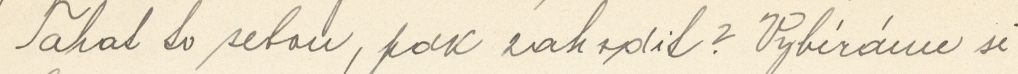Tahat to sebou, pak zahodit? Vybíráme si
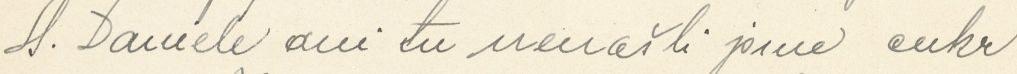St. Daniele ani tu nenašli jsme cukr
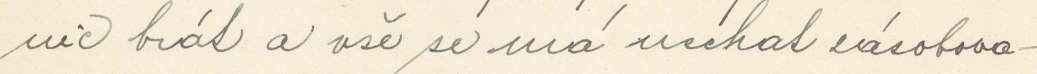nic brát a vše se má nechat zásobova-
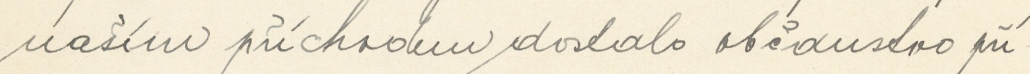naším příchodem dostalo občanstvo pří-
